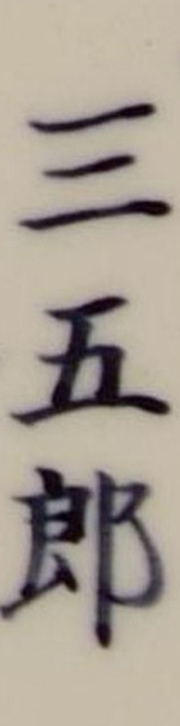三五郎
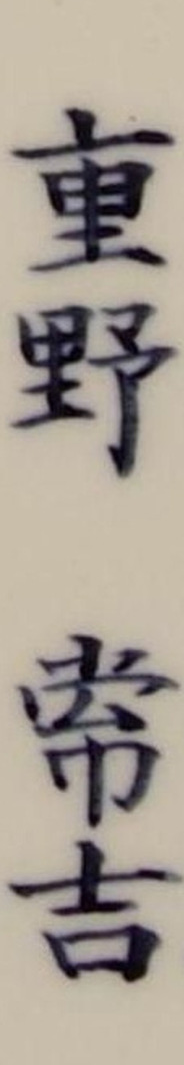重野常吉
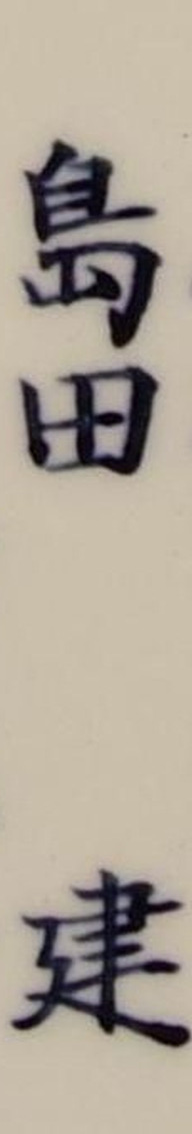島田建
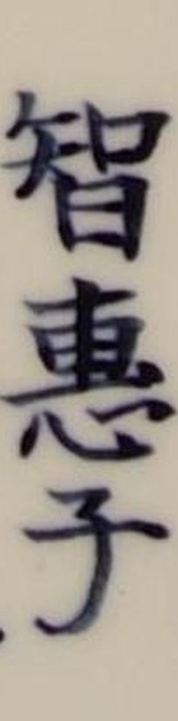智恵子
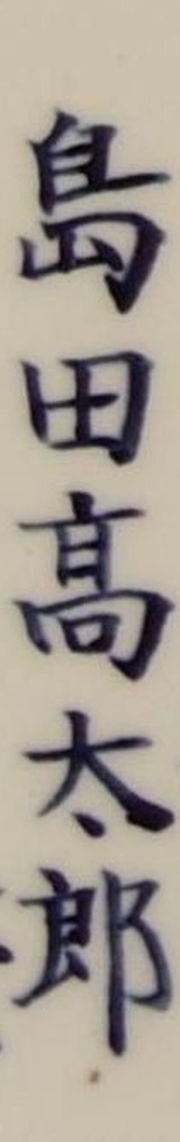島田高太郎
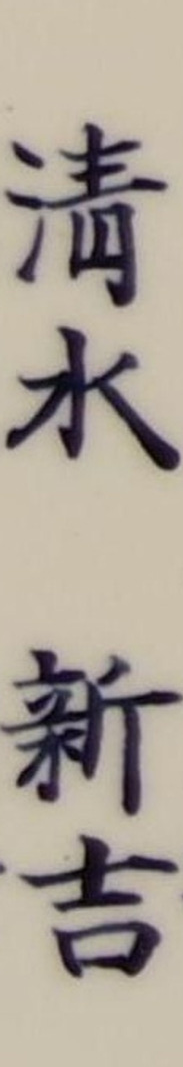清水新吉
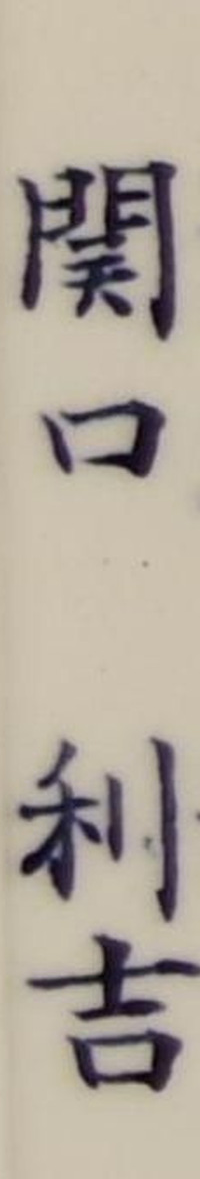関口利吉

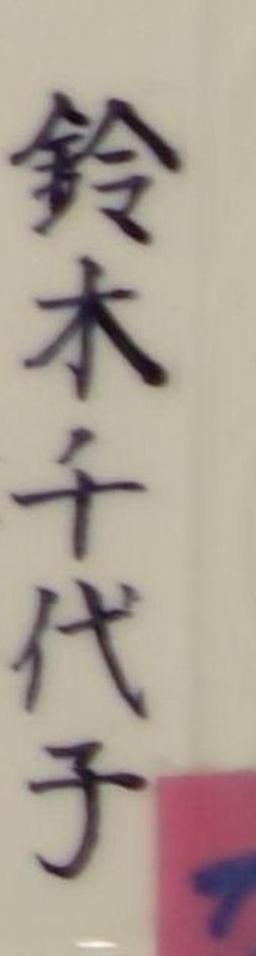鈴木千代子
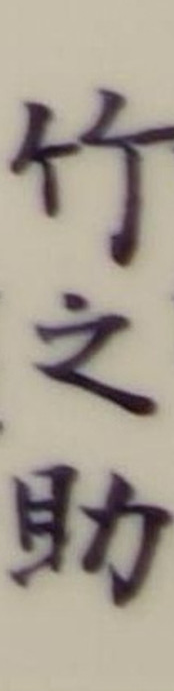竹之助
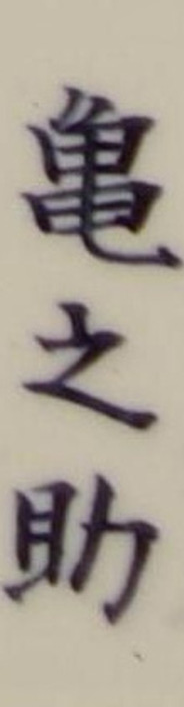亀之助
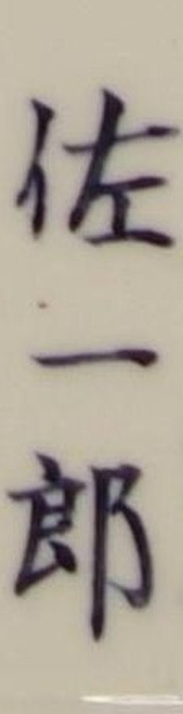佐一郎
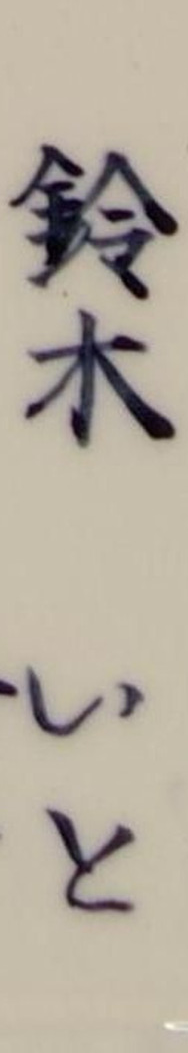鈴木いと
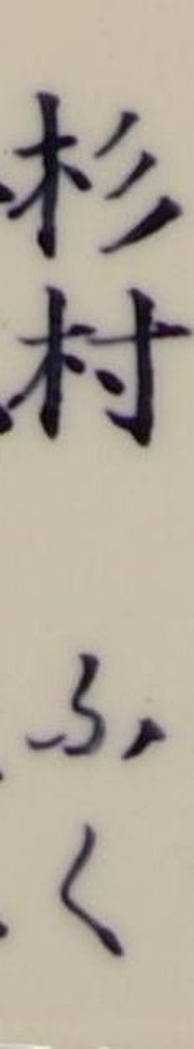杉村ふく
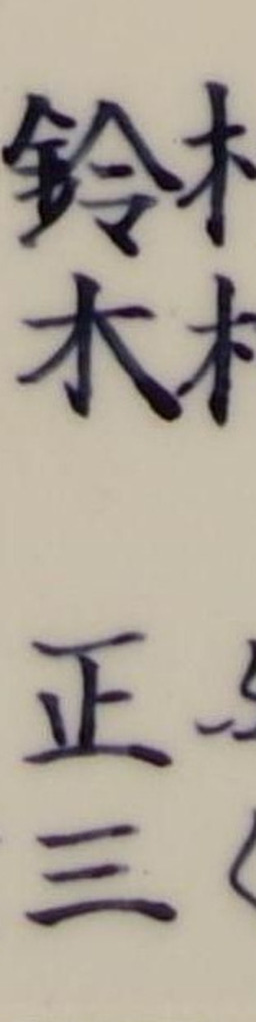鈴木正三
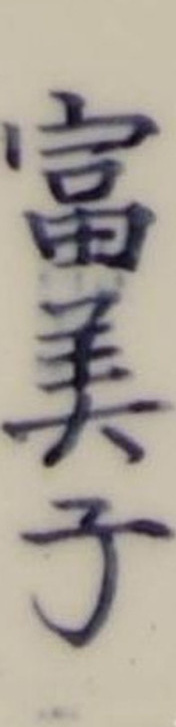富美子
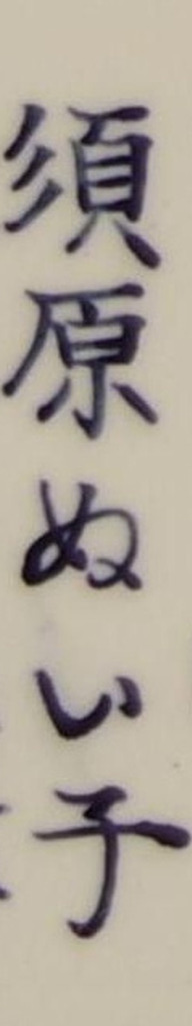須原ぬい子
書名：E~L
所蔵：高野山金剛峯寺
